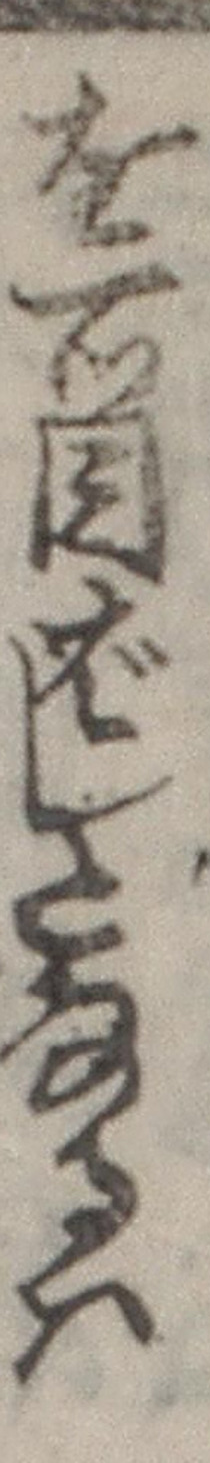を一ツ目ばしとなるは
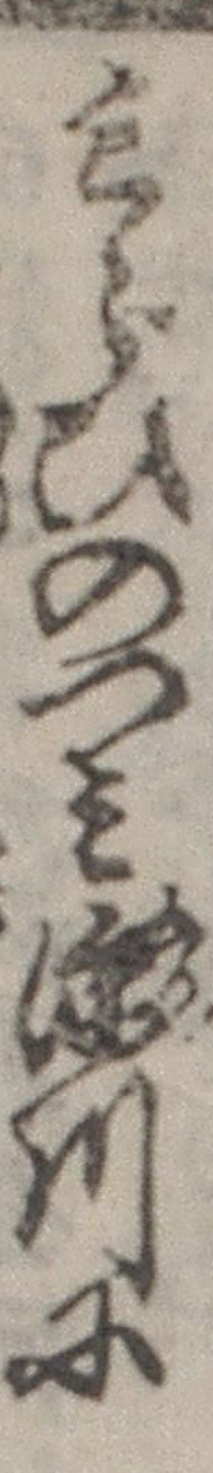みらひのつみ深川に
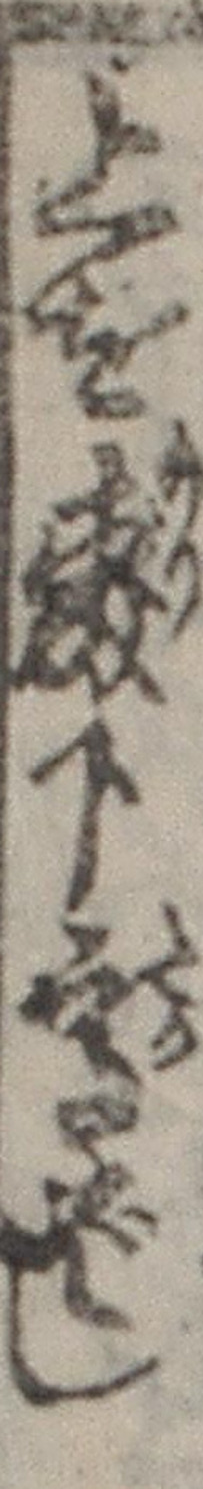上を森下鳥ばし
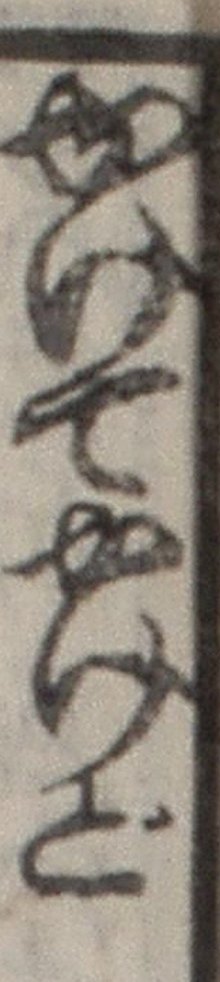かけてゆけど
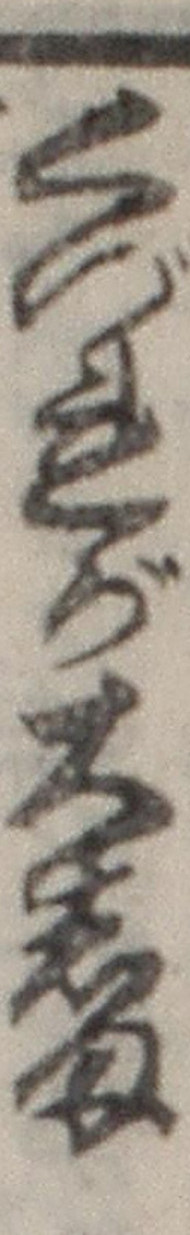くづれが大しま
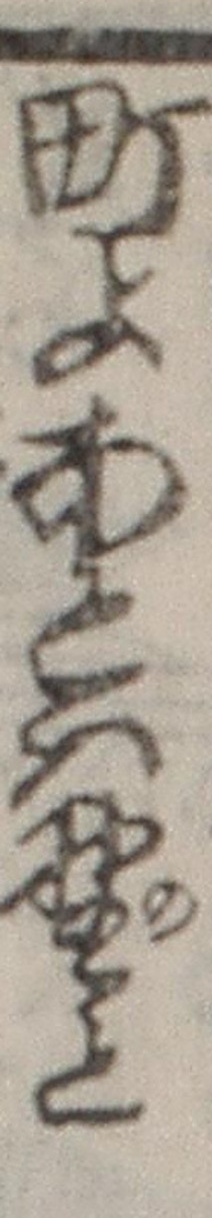町よあとは野と
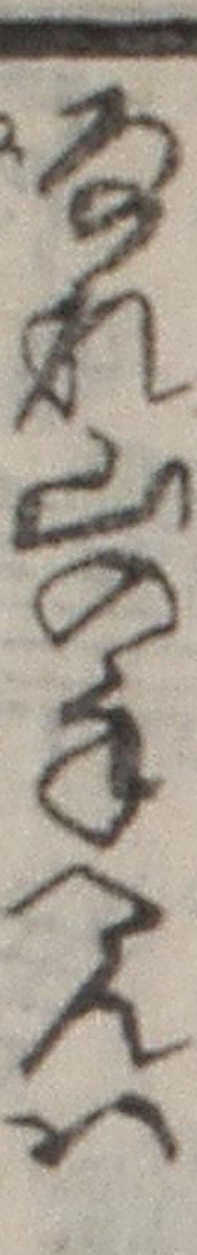なれ山の手へんは
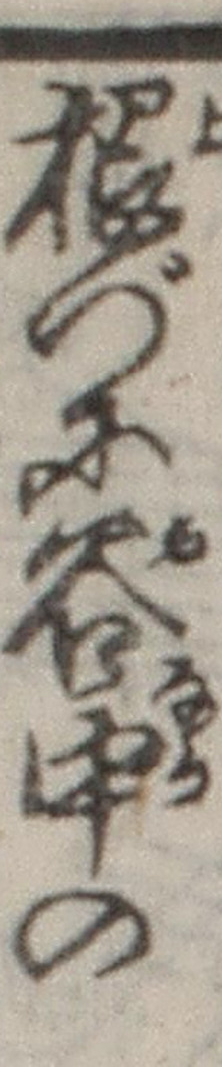根づに谷中の
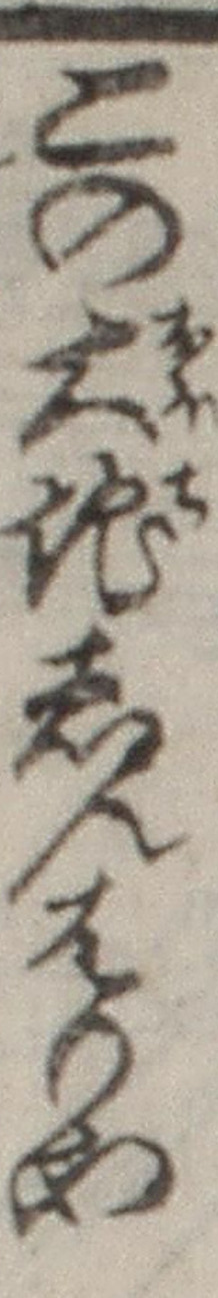この大地しんはりや
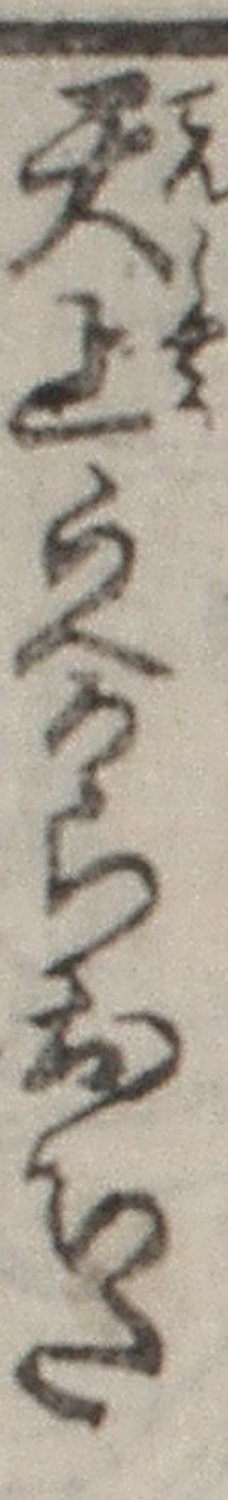天上うへからおちた
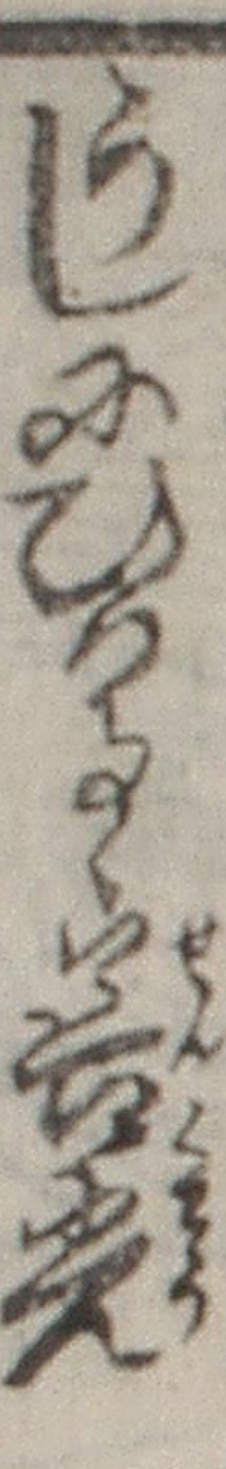うしにひかるゝ善光
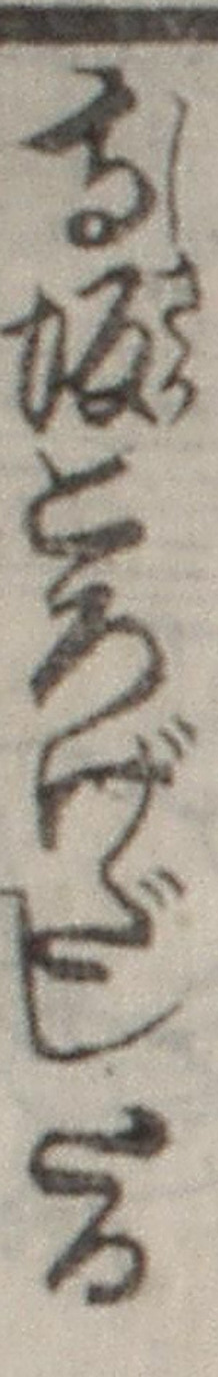寺坂ころげだしたる
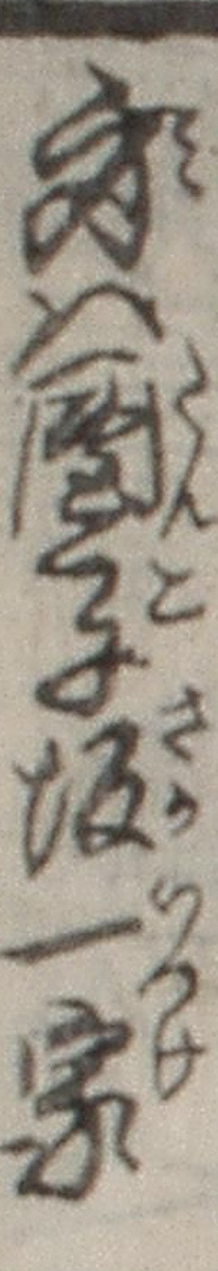身は団子坂一家
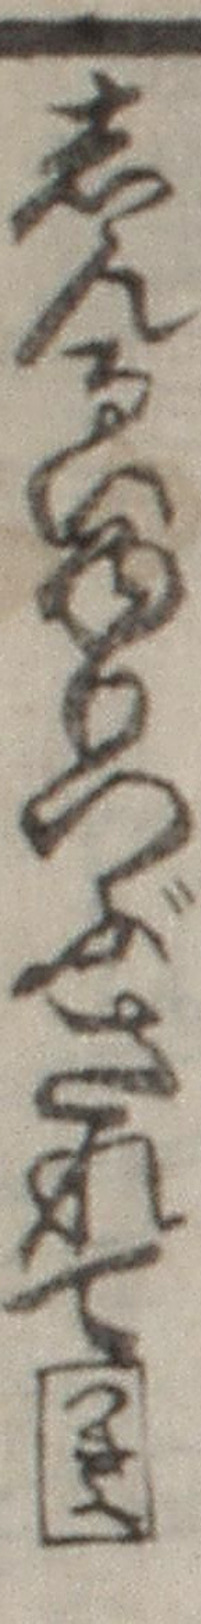しんるいゆりつぶされてつきへ

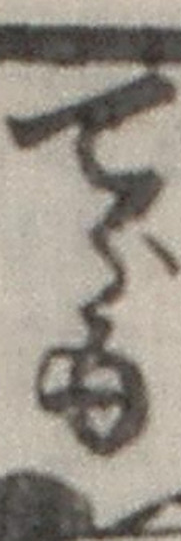てらも
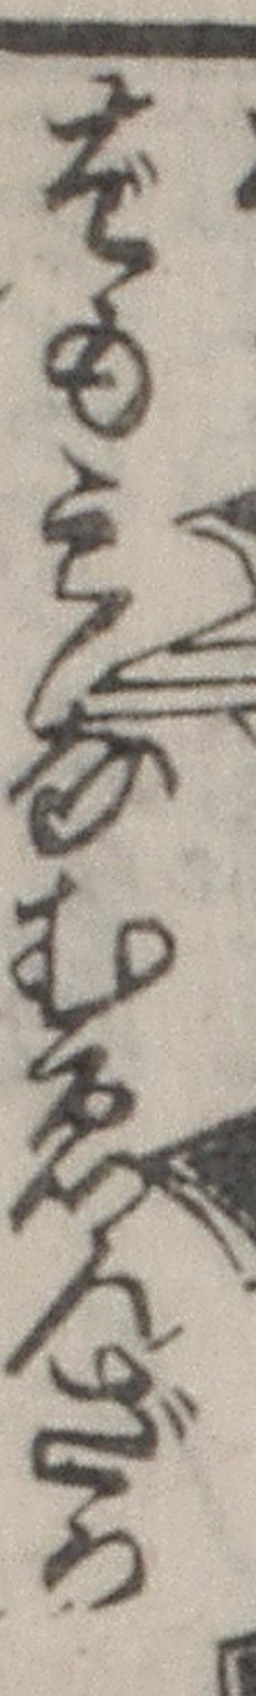ばもみなむゑんざか
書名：安政二卯年　江戸大地震并出火附
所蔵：東京大学地震研究所図書室 Earthquake Research Institute Library, The University of Tokyo, JAPAN
